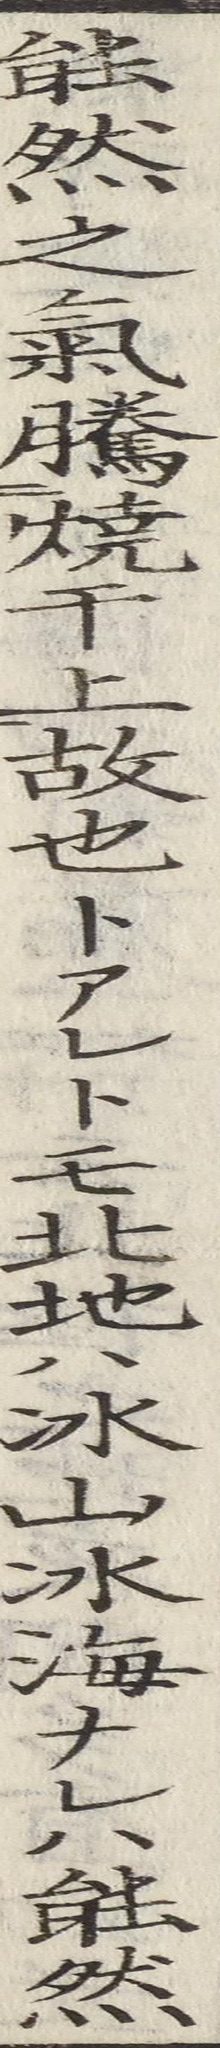能然之気騰ニ焼干上故也トアレトモ北地ハ氷山氷海ナレハ能然
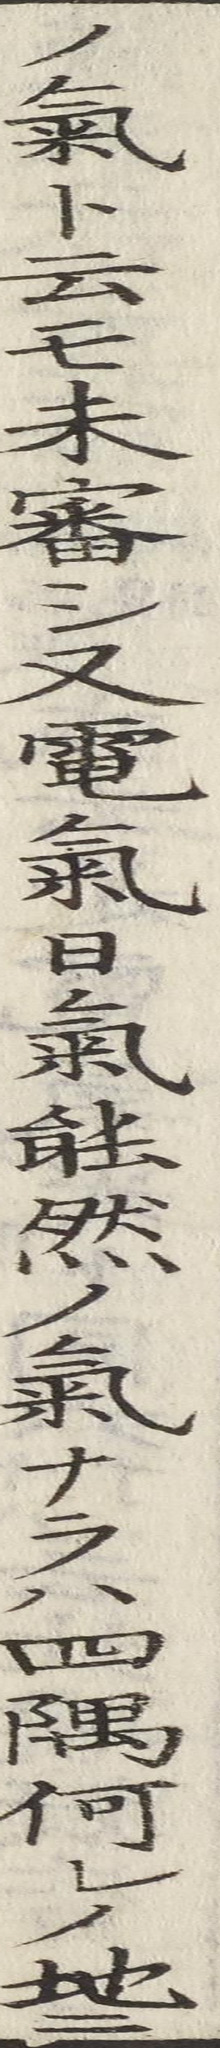ノ気ト云モ未審シ又電気日気能然ノ気ナラハ四隅何レノ地ニ
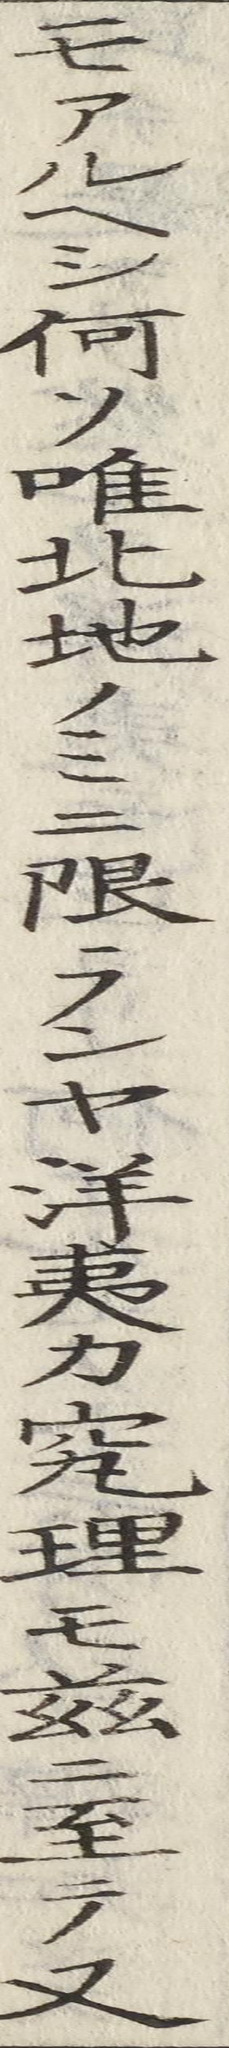モアルヘシ何ソ唯北地ノミニ限ランヤ洋夷カ究理モ茲ニ至テ又
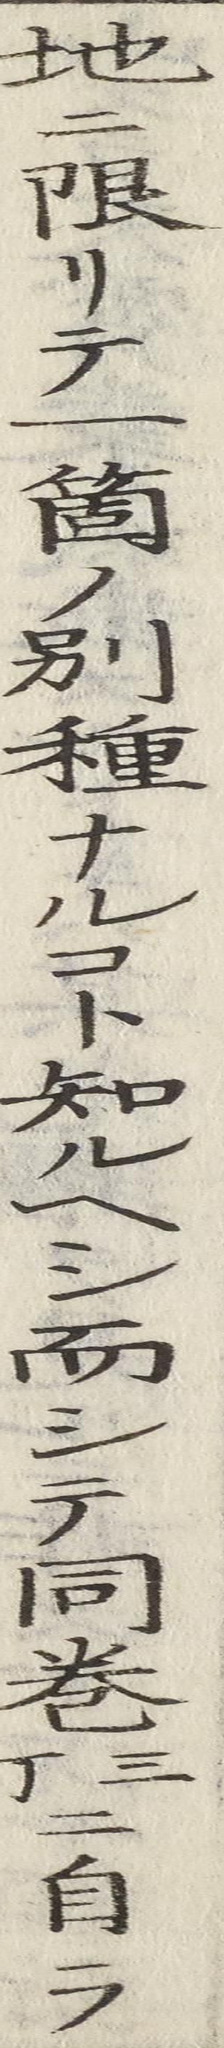地ニ限リテ一箇ノ別種ナルコト知ルヘシ而シテ同巻三丁ニ自ラ
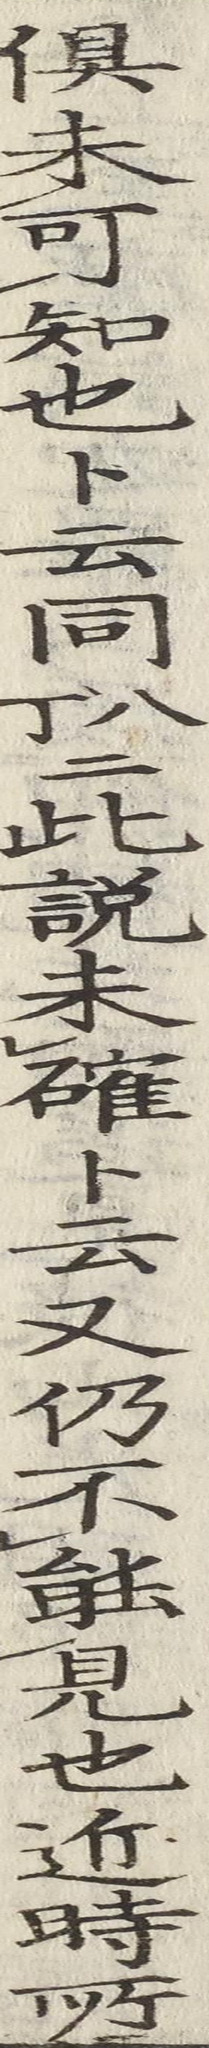俱未可知也ト云同八丁ニ此説未確ト云又仍不能見也近時所
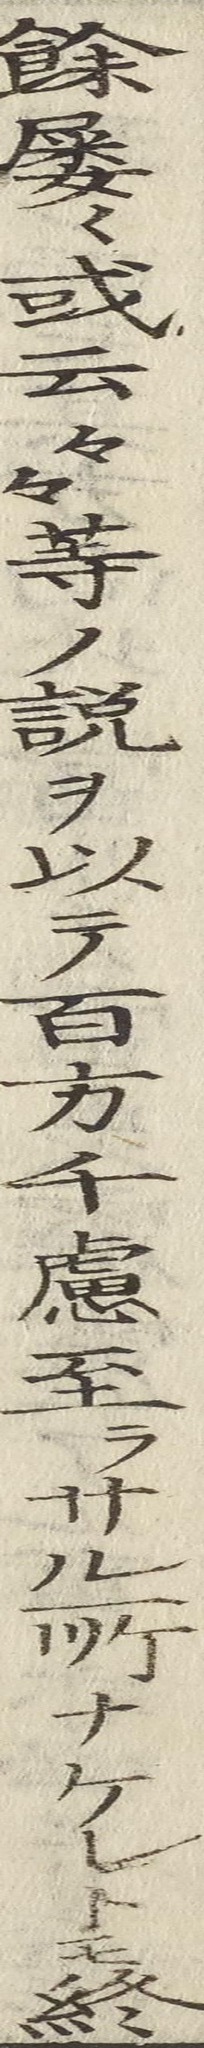余屢〱或云々々等ノ説ヲ以テ百方千慮至ラサル所ナケレトモ終
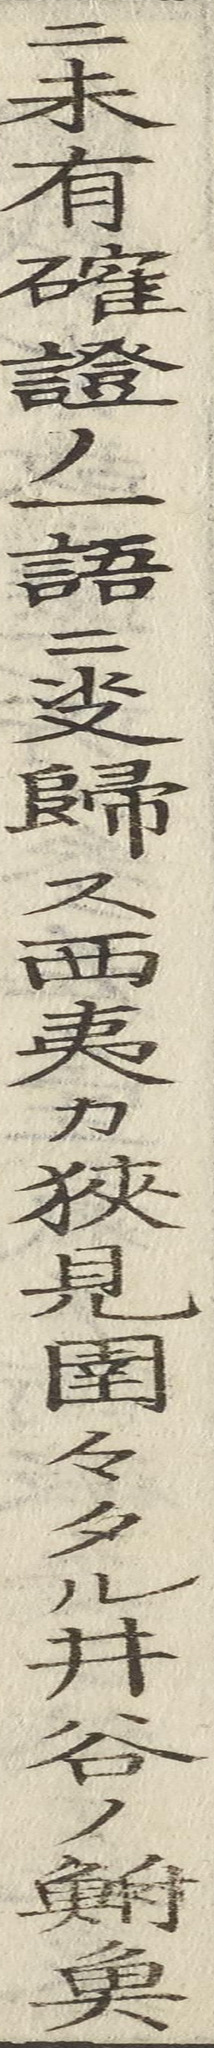ニ未有確証ノ一語ニ決帰ス西夷カ狭見圉々タル井谷ノ鮒魚
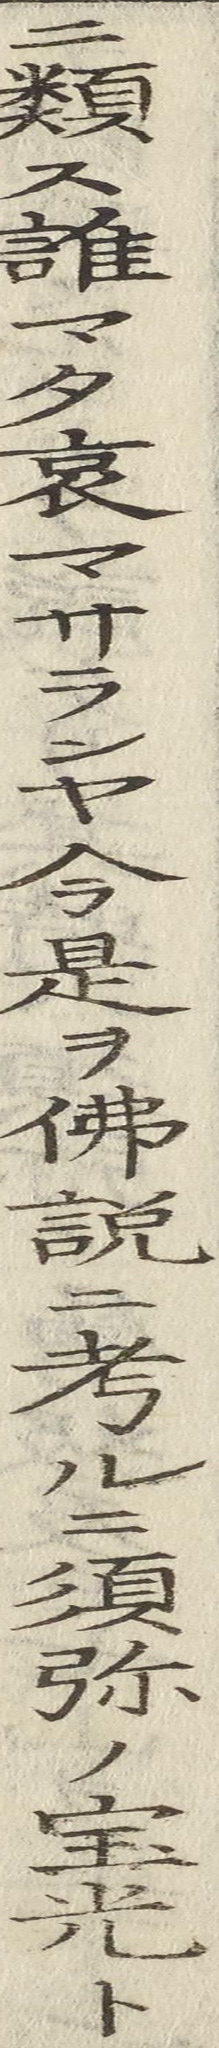ニ類ス誰マタ哀マサランヤ今是ヲ仏説ニ考ルニ須弥ノ宝光ト
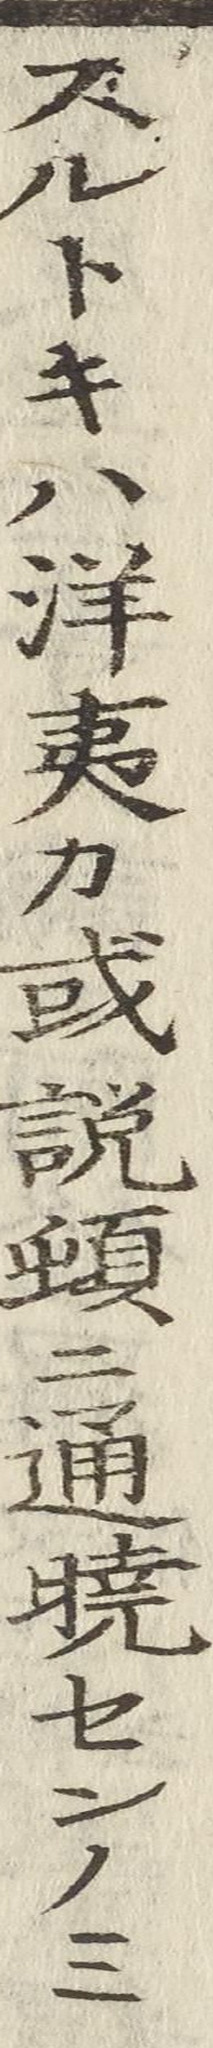スルトキハ洋夷カ或説頓ニ通暁センノミ
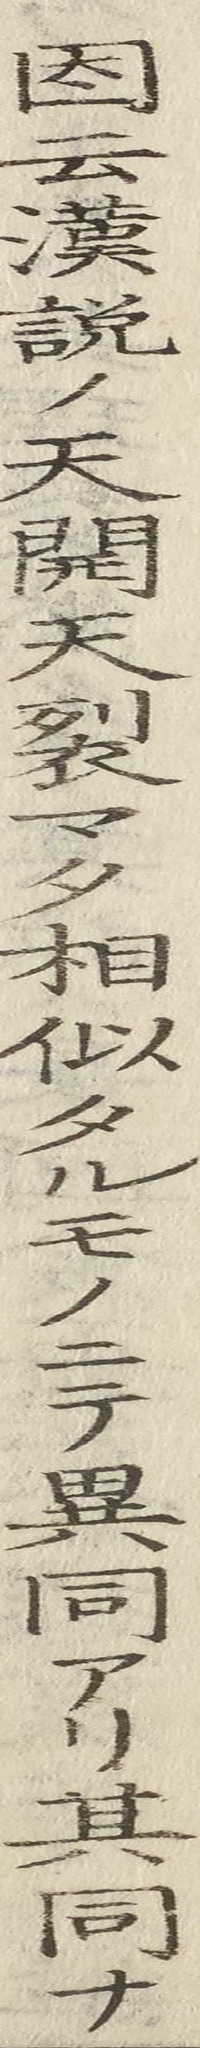因云漢説ノ天開天裂マタ相似タルモノニテ異同アリ其同ナ
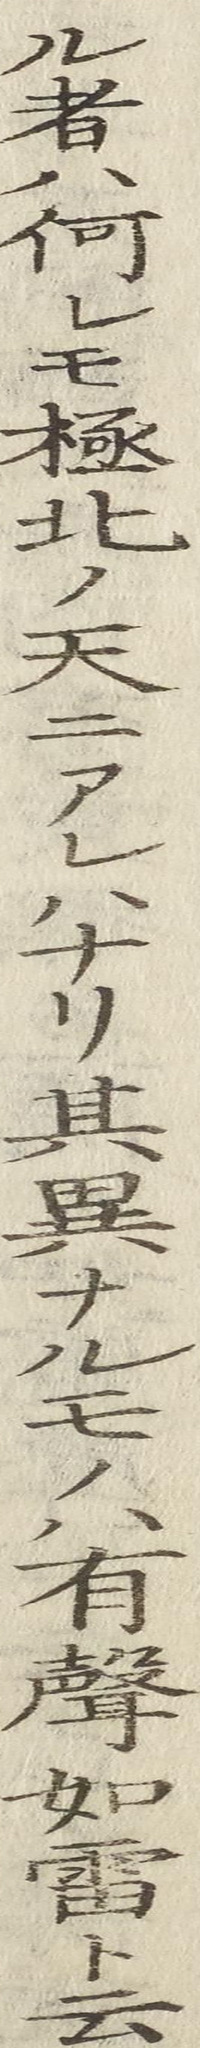ル者ハ何レモ極北ノ天ニアレハナリ其異ナルモノハ有声如雷ト云
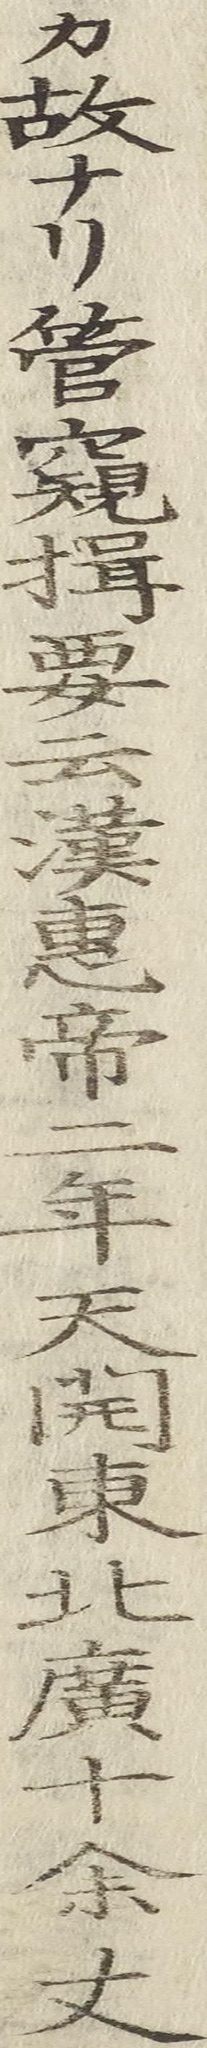カ故ナリ管窺揖要云漢恵帝二年天開東北広十余丈
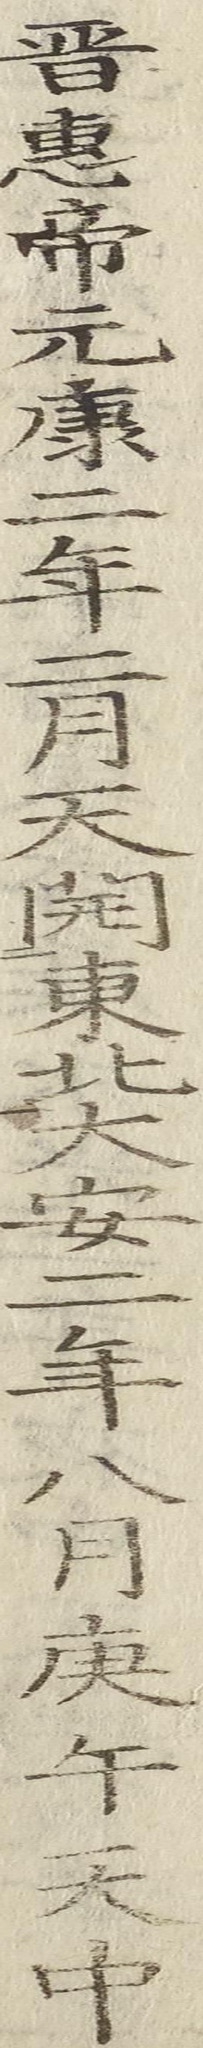晋恵帝元康二年二月天開ニ東北大安二年八月庚午天中

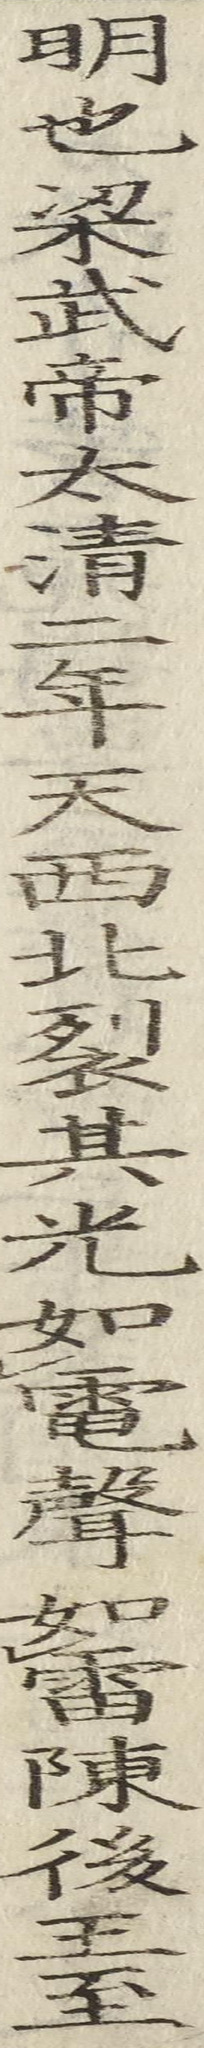明也梁武帝太清二年天西北裂其光如雷声如雷陳後王至
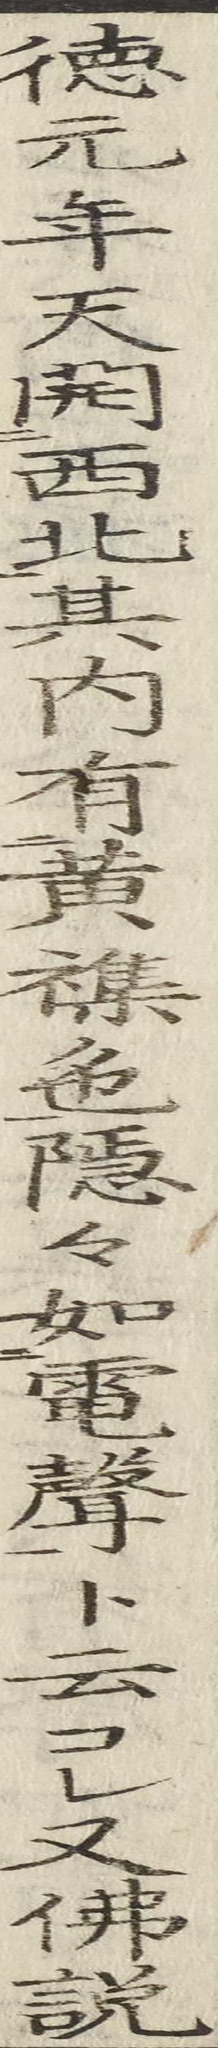徳元年天開ニ西北其内有ニ黄襍色隠々如ニ電声ト云コレ又仏説
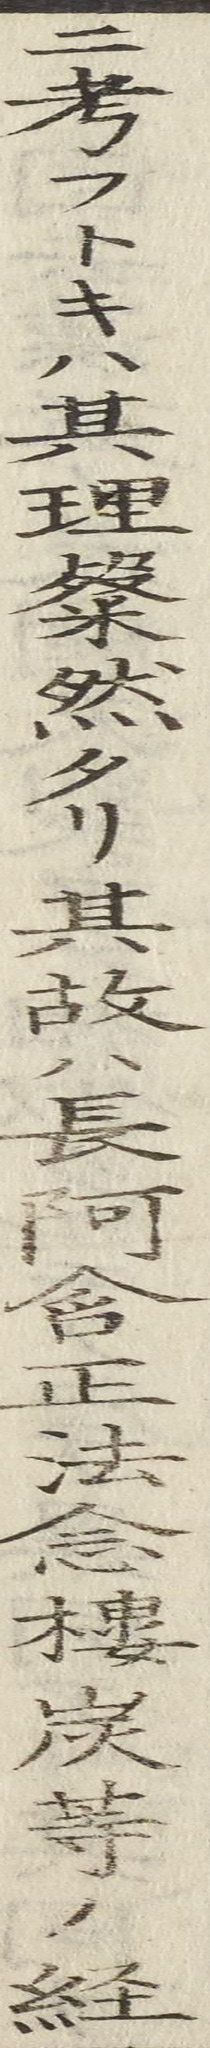ニ考フトキハ其理粲然タリ其故ハ長阿含正法念楼炭等ノ経
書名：護法新論　二編　中
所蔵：東京大学地震研究所図書室 Earthquake Research Institute Library, The University of Tokyo, JAPAN
